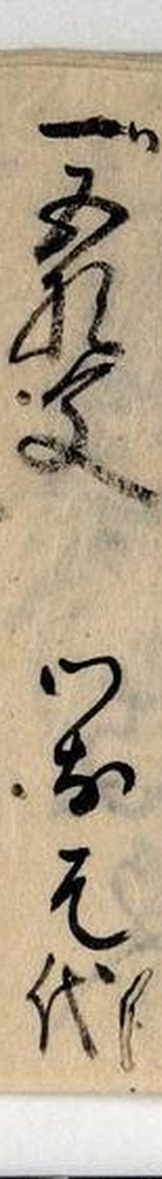一五拾文つなそ代
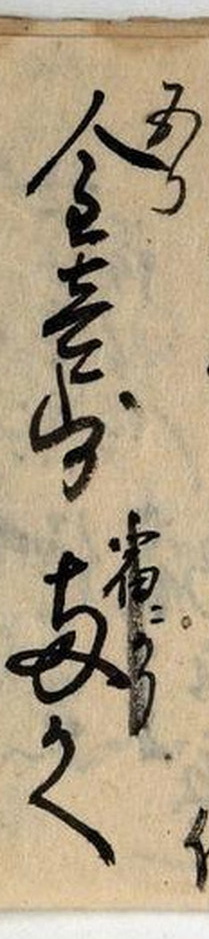金壱歩両かへ
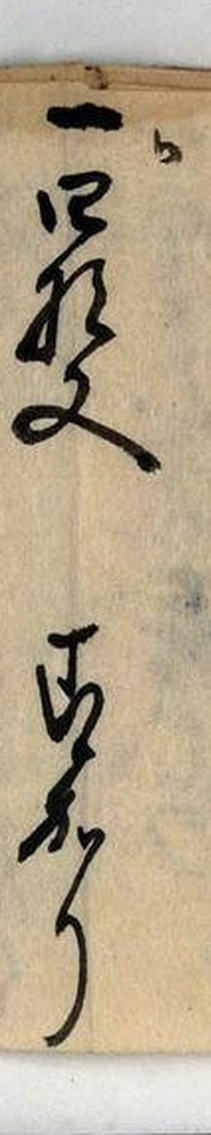一四拾文すかり
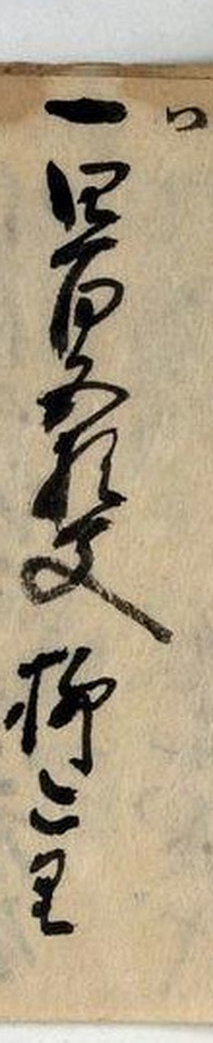一四百五拾文柳こり
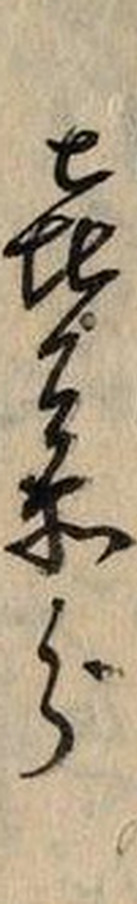喜兵衛分
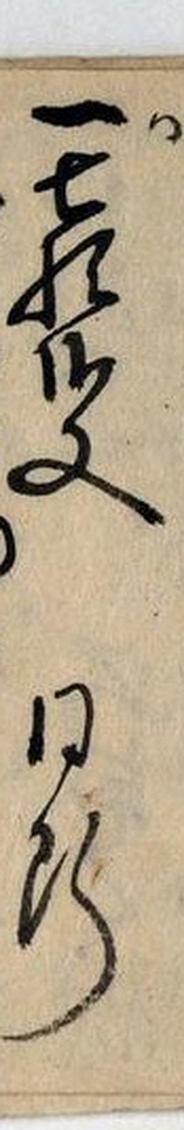一七拾弐文同断
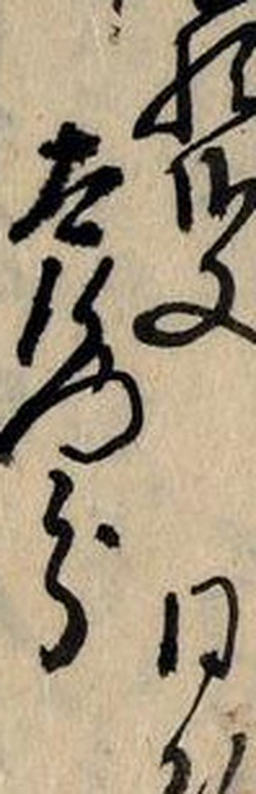太左衛門分
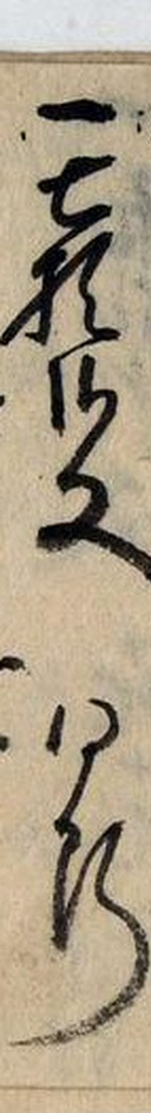一七拾弐文同断
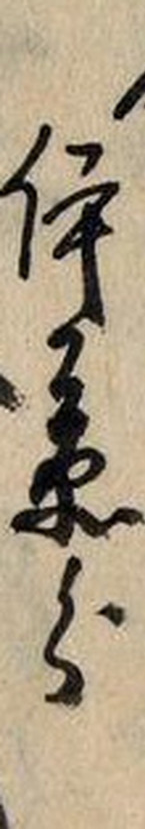伊兵衛分
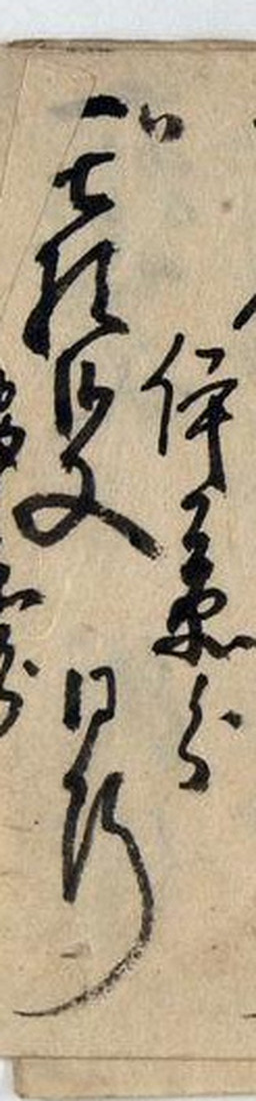一七拾弐文同断

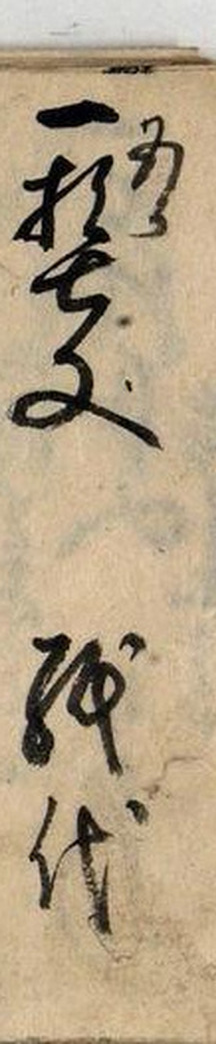一拾七文紙代
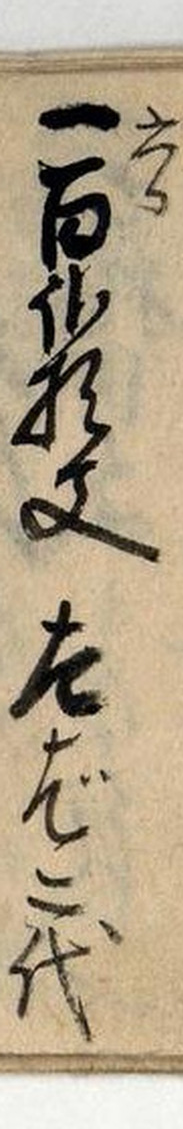一百弐拾文たばこ代
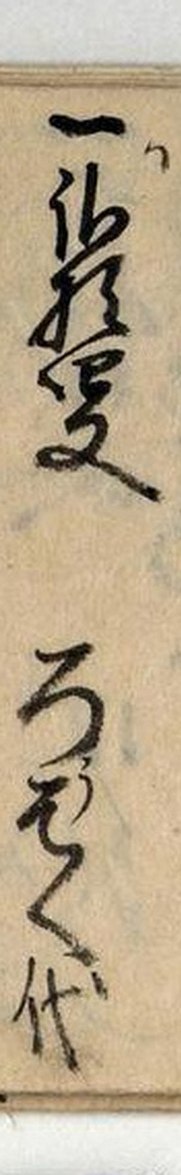一弐拾四文ろうそく代
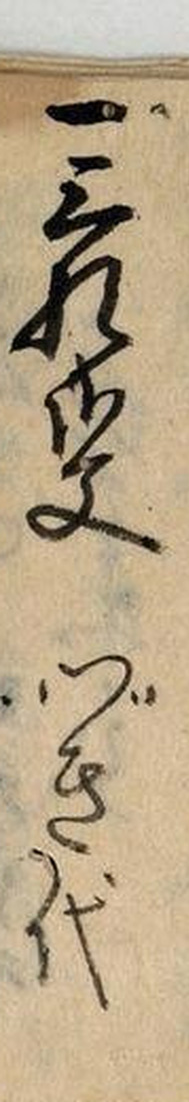一三拾弐文づき代
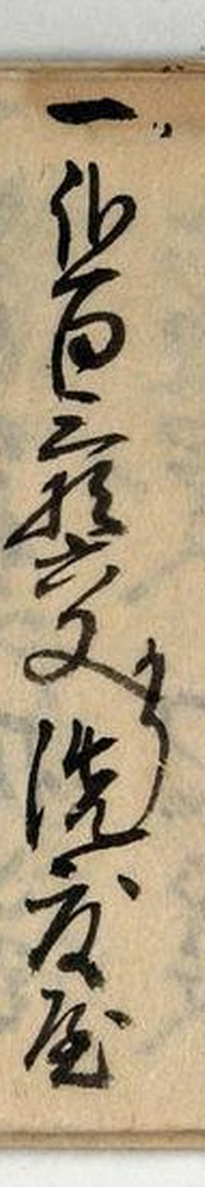一弐百三拾六文洗度屋
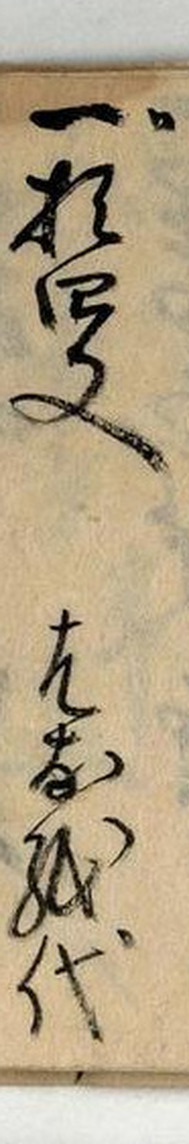一拾四文はな紙代
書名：道中小遣留帳（旅）
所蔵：福井県文書館 Fukui Prefectural Archives
